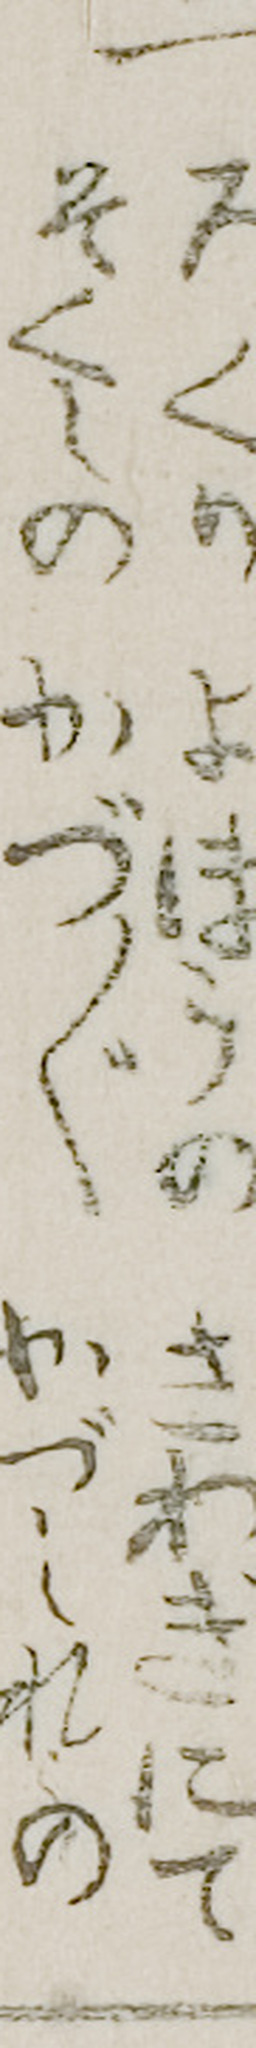そくしのかづ〴〵かづしれの
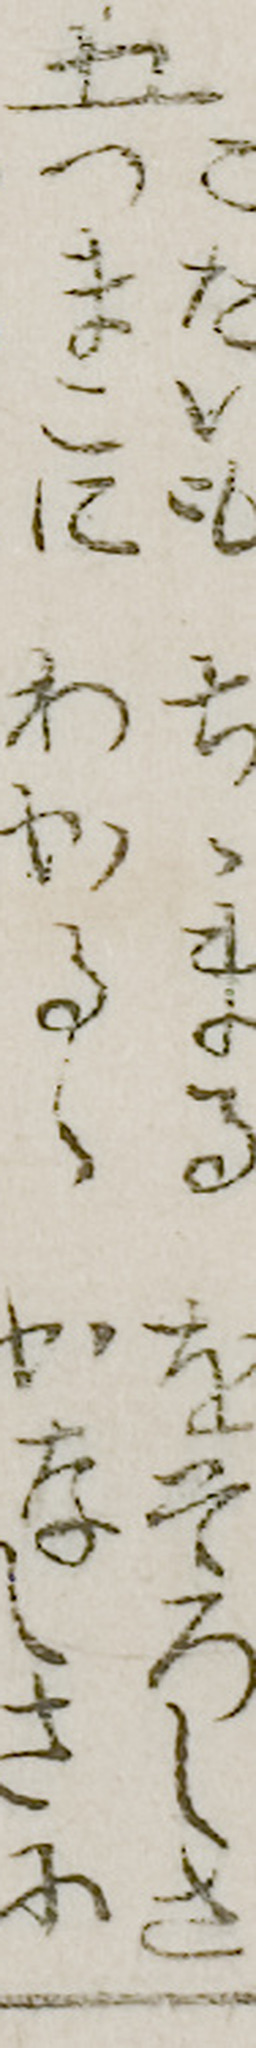十五つまこにわかるゝかなしさに
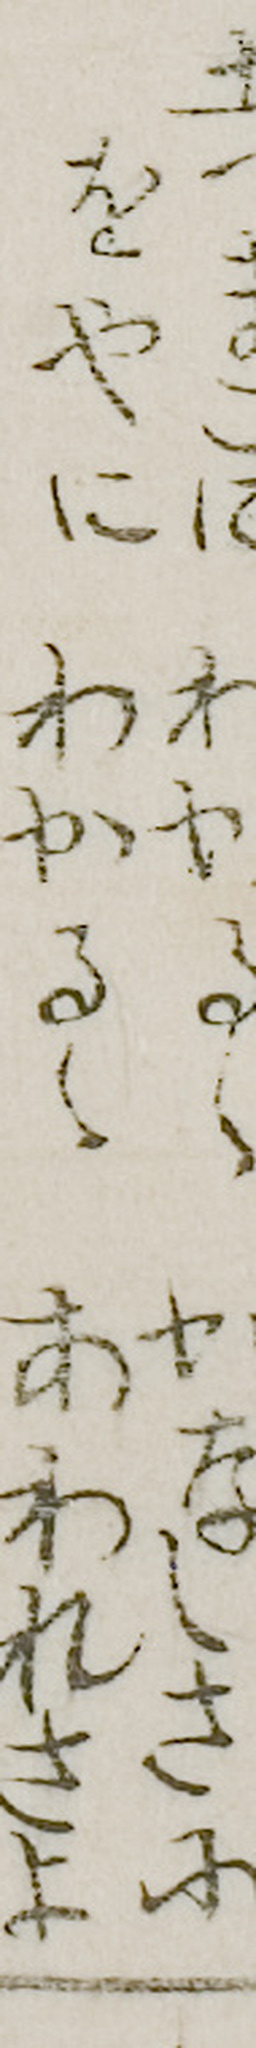をやこわかるゝあわれさよ
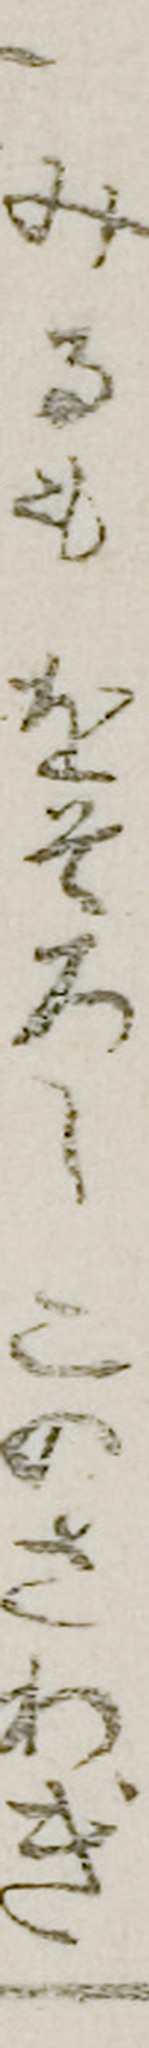みるもをそろしこのさわぎ
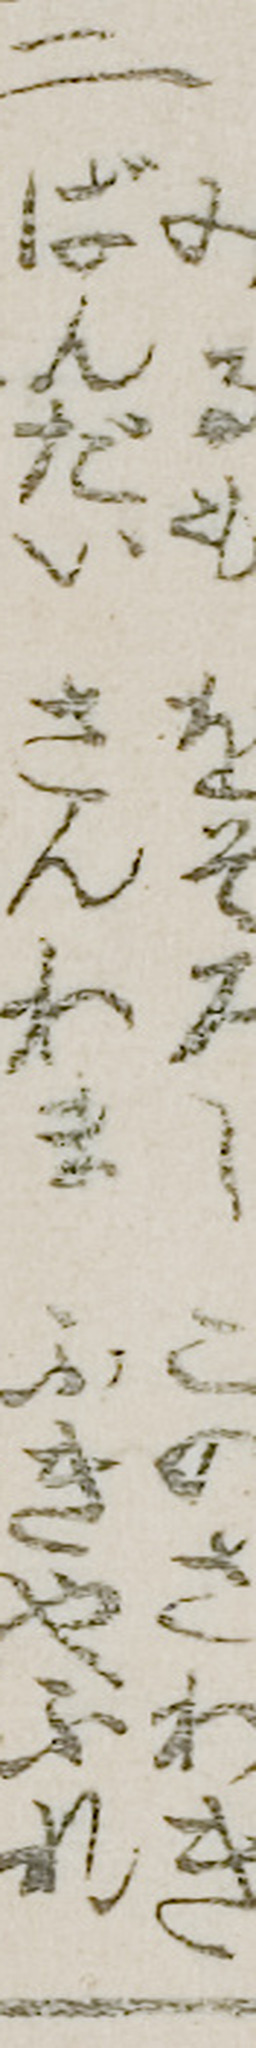三ばんだいさんわまふきやぶれ
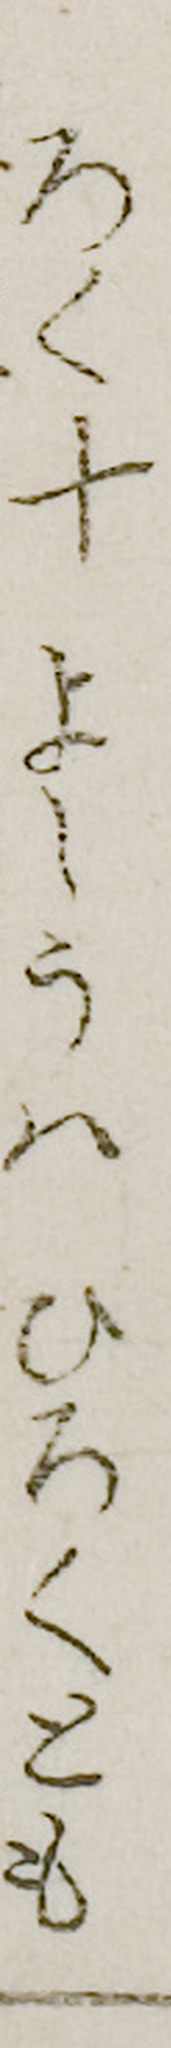ろく十よしうハひろくとも
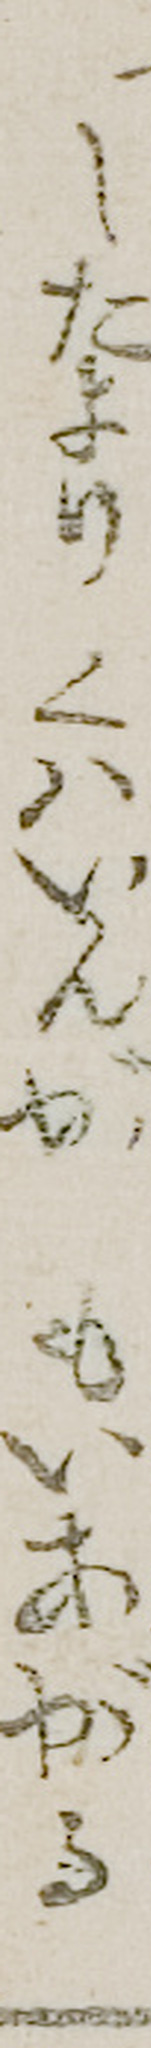したよりくハいんがもいあがる
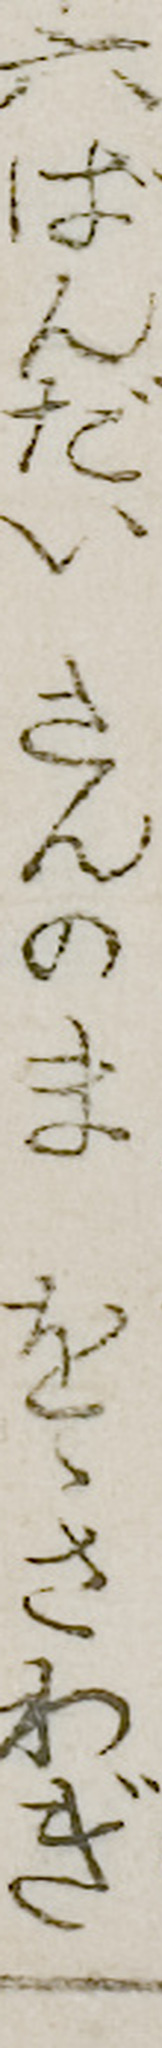十六ばんだいさんのまをゝさわぎ
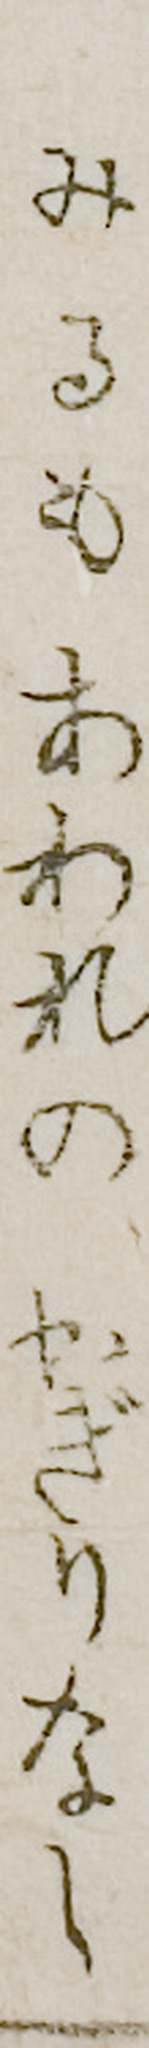みるもあわれのかぎりなし
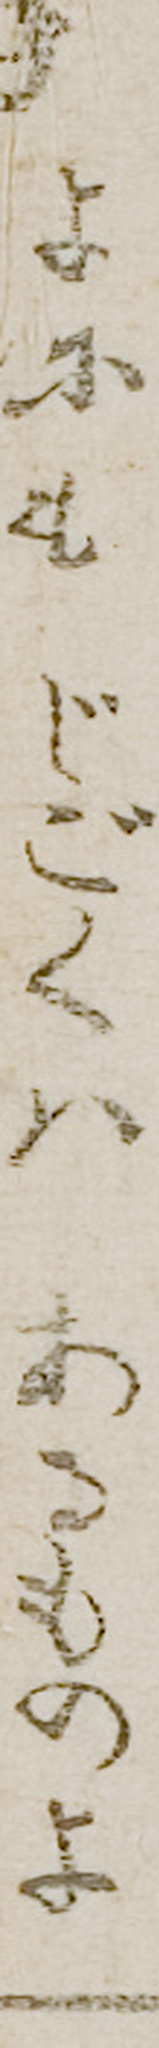よにもじごくハあるものよ
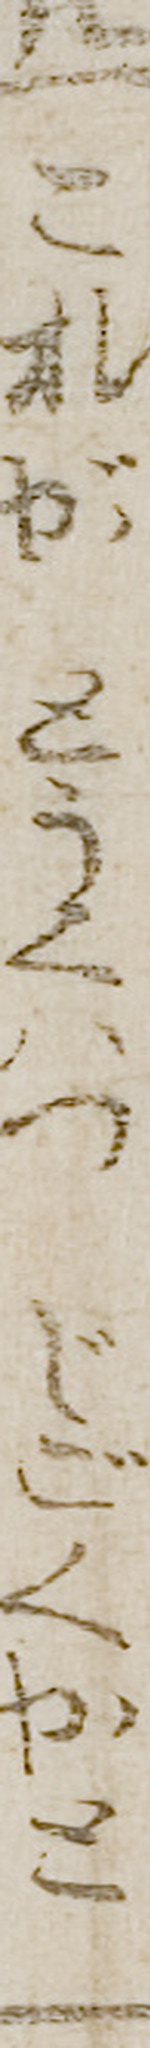四これがとうくハつハじごくかと
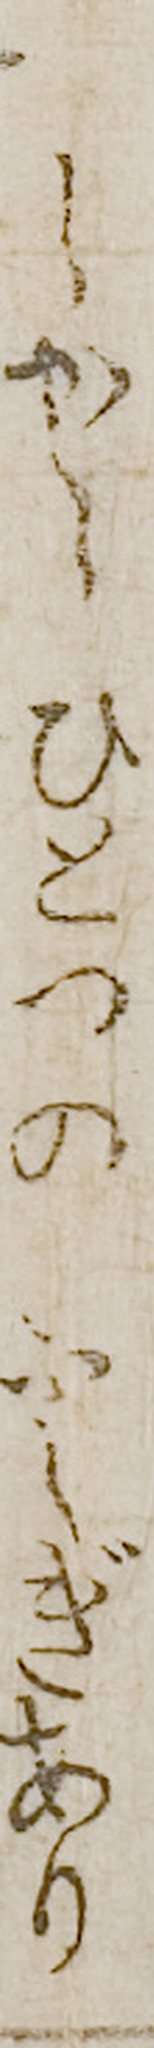しかしひとつのふしぎあり
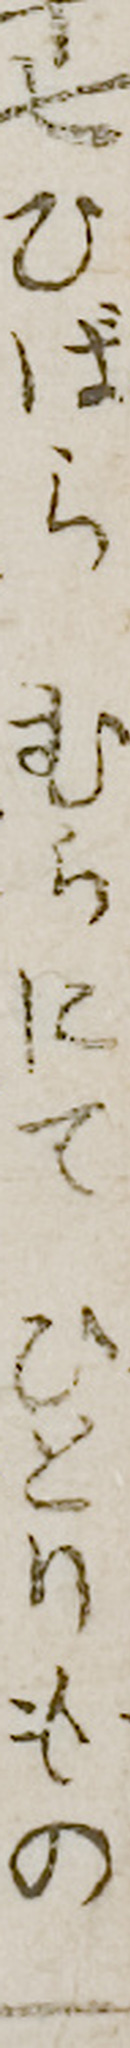十七ひばらむらにてひとりもの
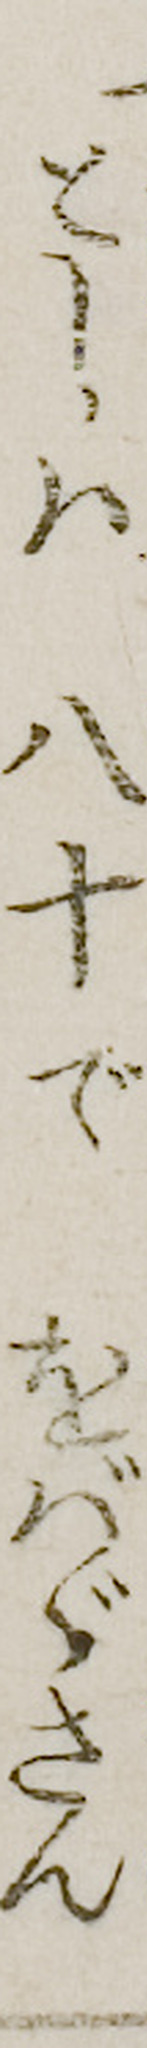としハ八十でをバゞさん
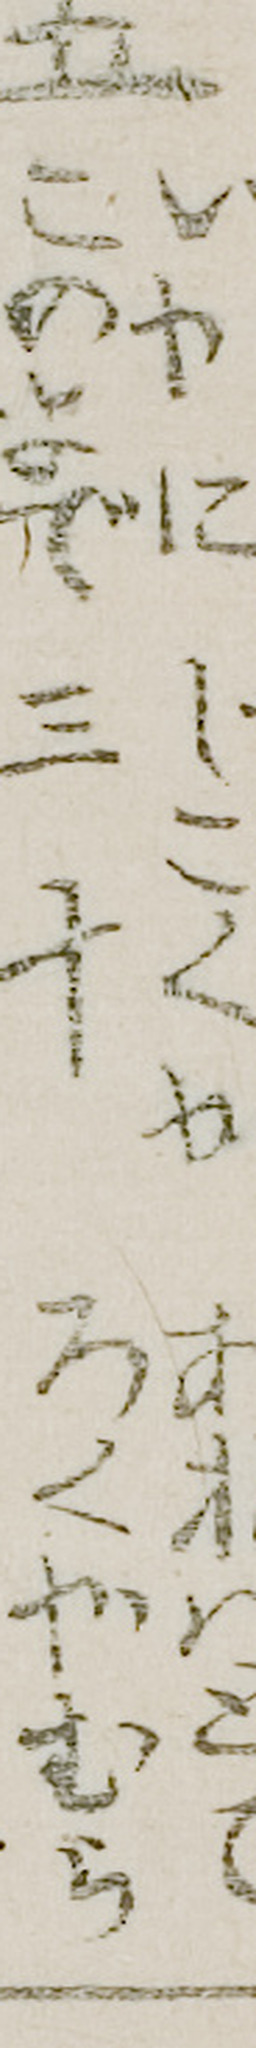五このよで三十ろくかむら
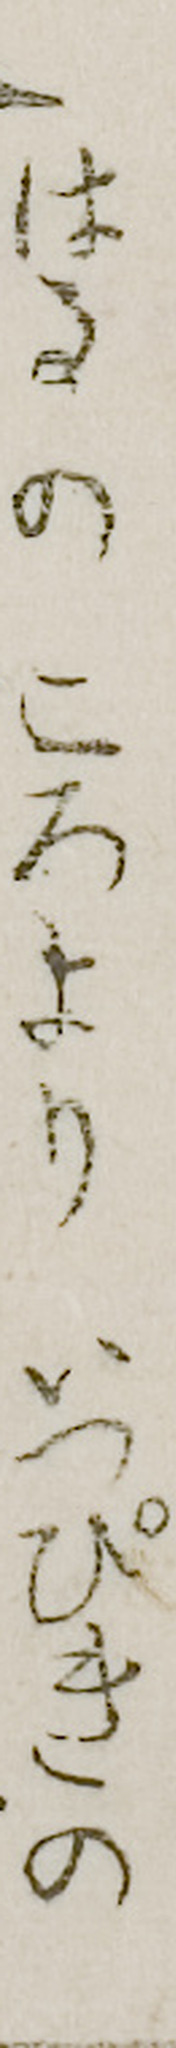はるのころよりいつぴきの
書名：会津ばんだいさん大くづれはなし
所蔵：東京大学総合図書館 General Library in the University of Tokyo, JAPAN
